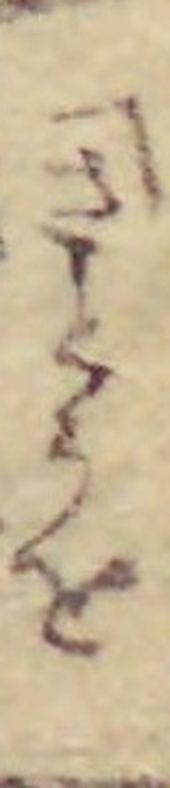〽さとうを
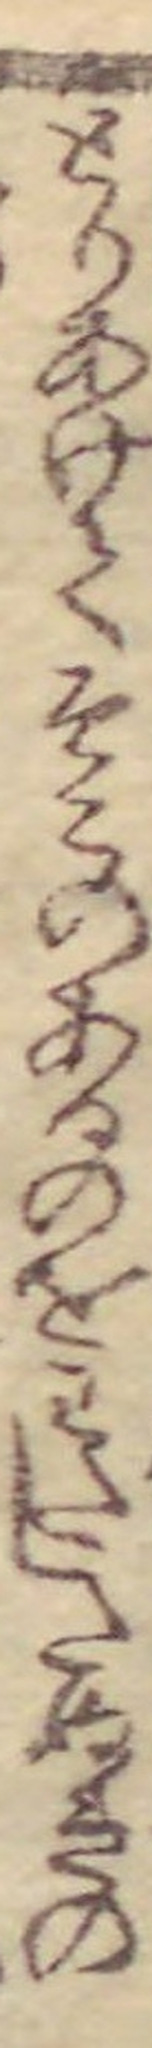とりあけてそこのあるのをわたしたぬきの
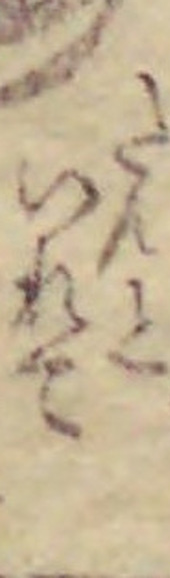いれて
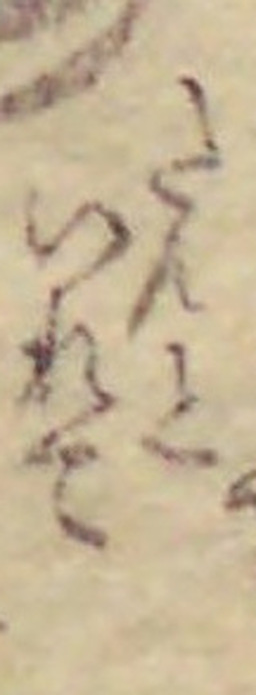いれて
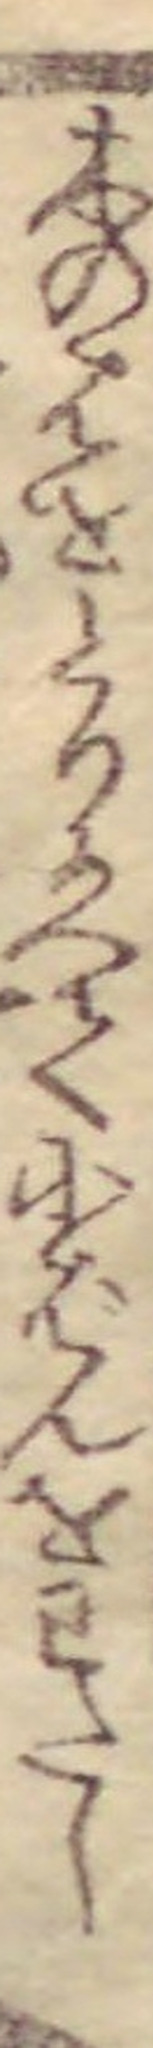木のはをとりかへて小ばんをわたし
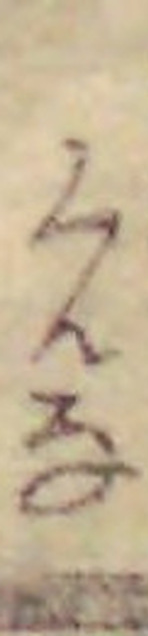くんな
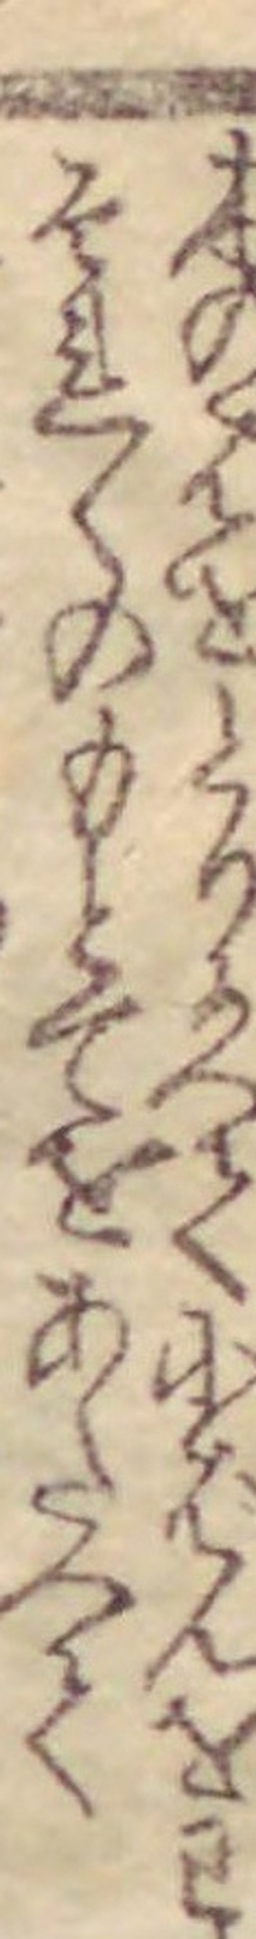それ〳〵のもとてをあたへて
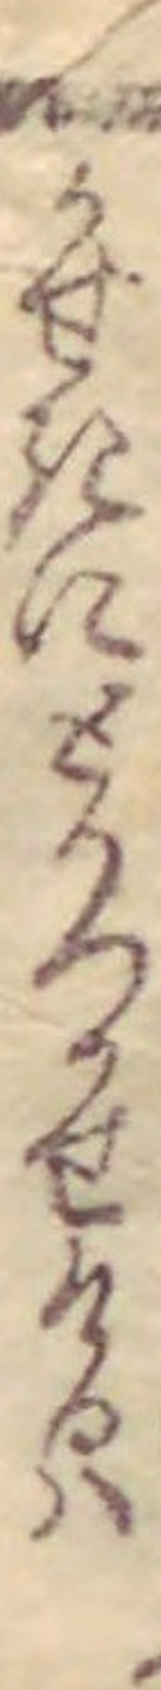かせきにとりつかせけるは
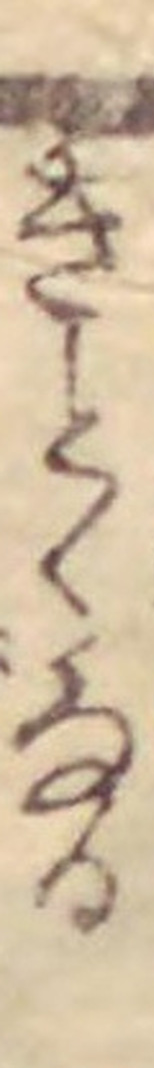きとくなる
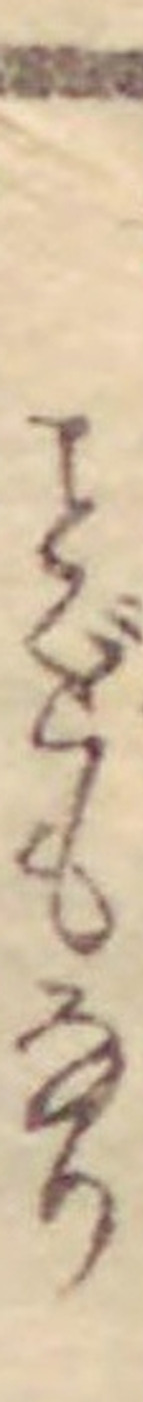ことどもなり
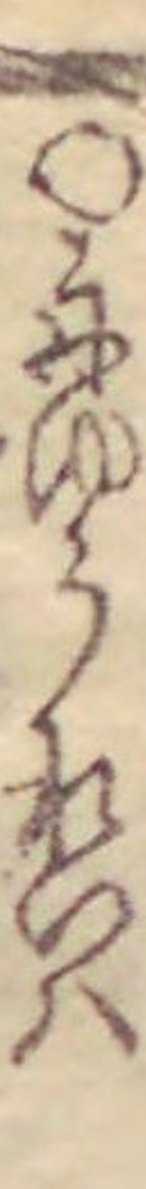○舟ゆうれいは
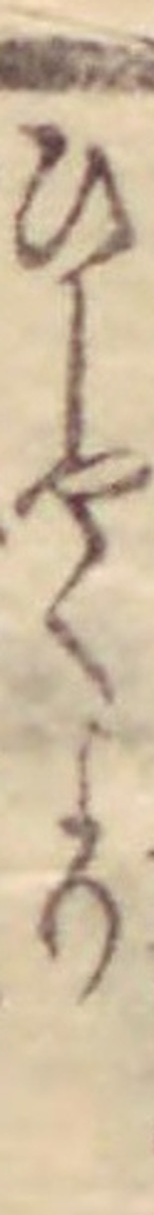ひしやくより
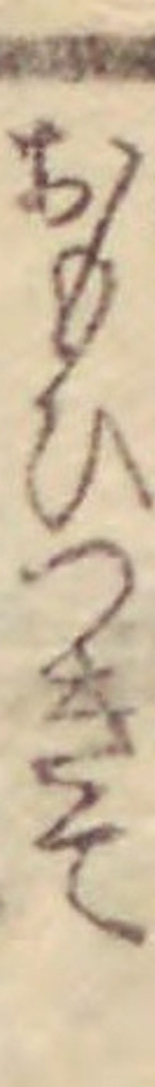おもひつきて
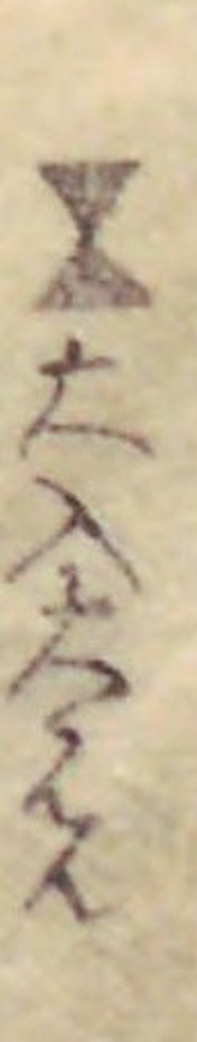▼▲大入大はん
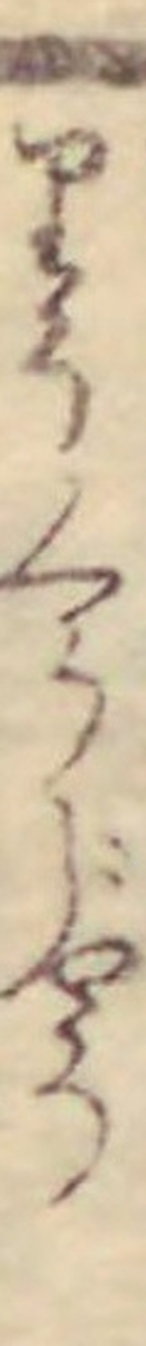りうくうじやう
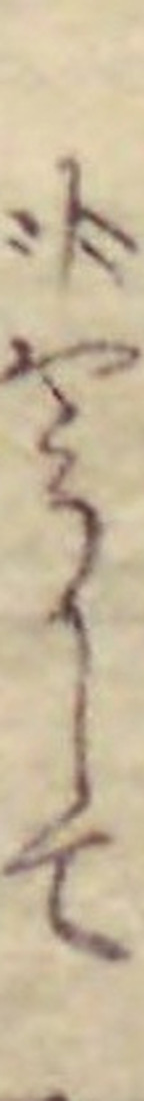じやうして
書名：化物世帯氣質
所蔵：国立国会図書館 National Diet Library, JAPAN
